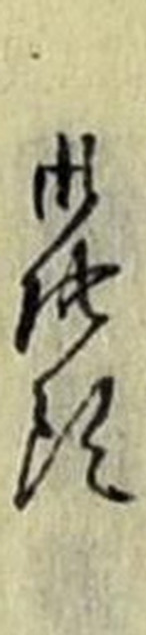御供頭
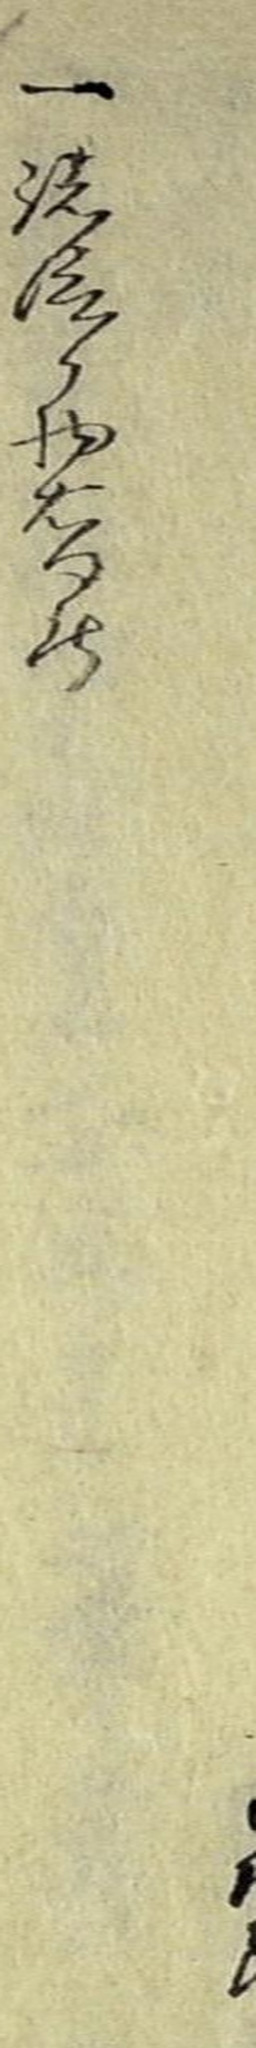一諸渡り物右同断
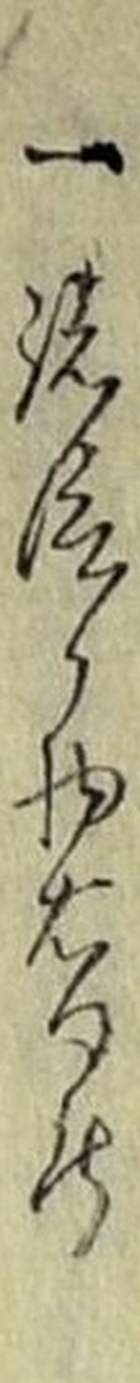一諸渡り物右同断
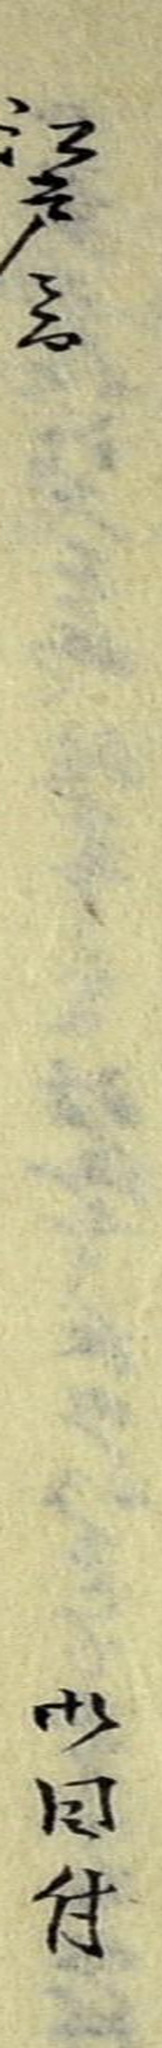江戸に而御目付
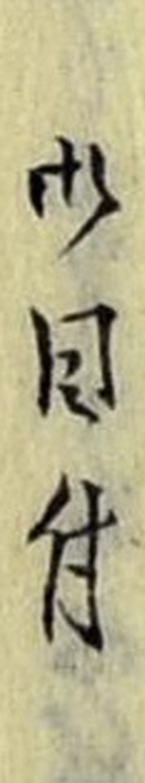御目付

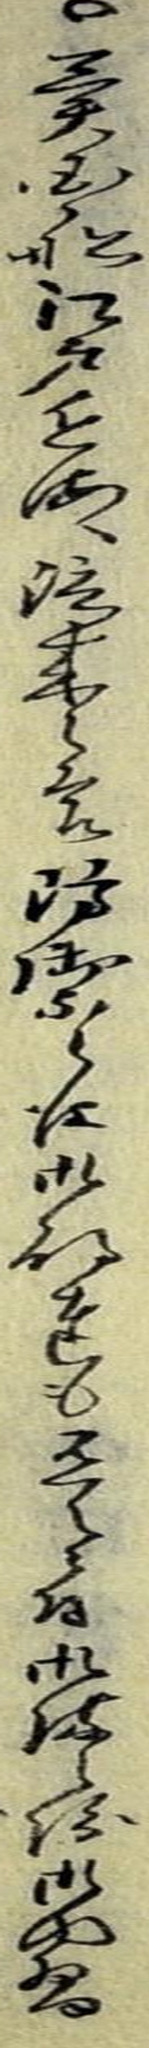○異国船江戸近海へ渡来之節防禦之儀御触達も有之に付御備之儀御内習
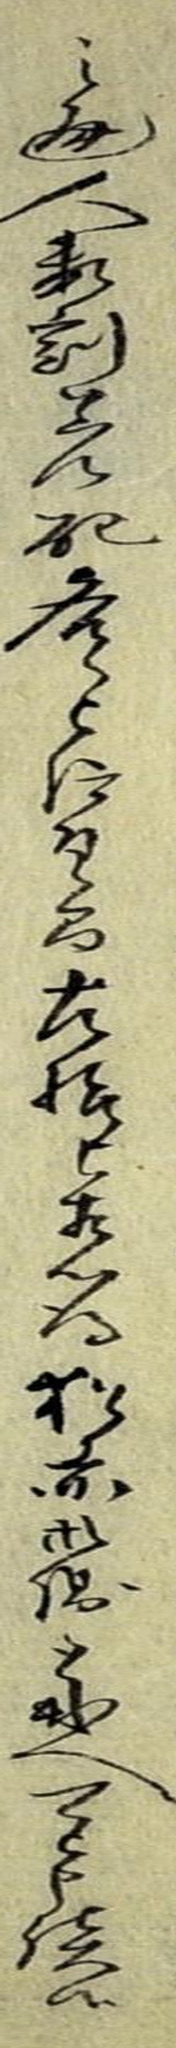之通人数割差配各被仰付候間左様被相心得猶亦御側御用人可被申談候
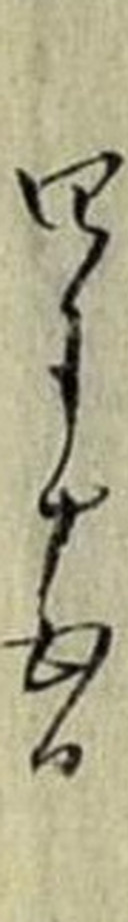四月十五日
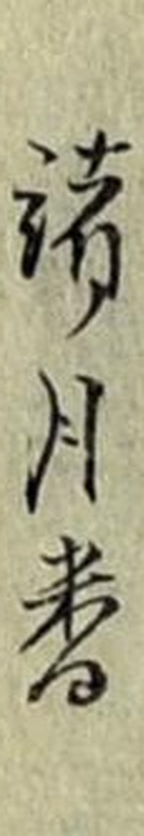諸月番
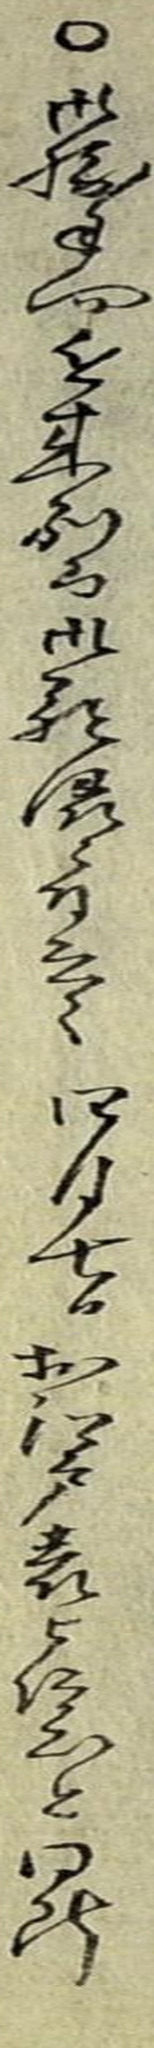○御勝手向近来別而御難渋に付云々四月十七日於江戸表被仰出候と同断
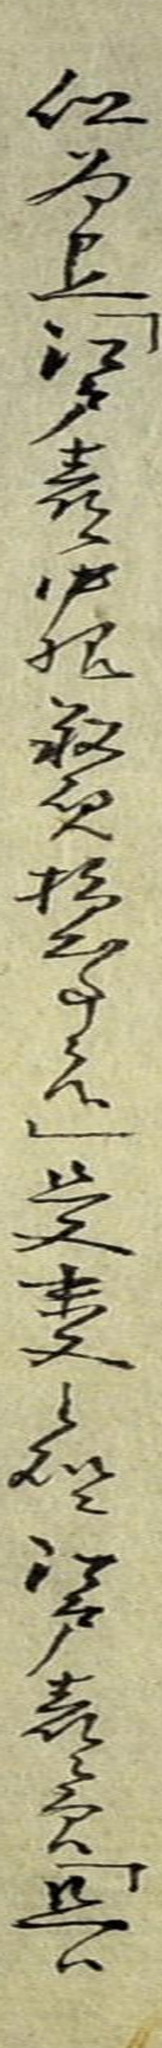但為申上「江戸表へ中根靭負指出事に候」且又末文之処に江戸表に而は「且は
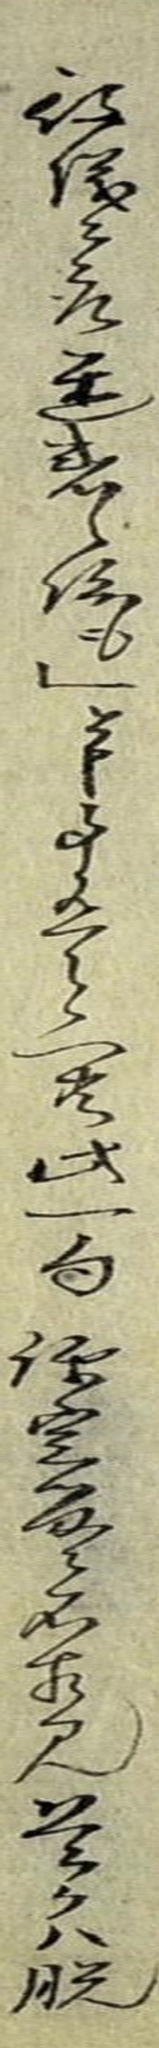役儀に取迷惑之儀も」と申事有之候へ共此一句評定留に不相見上ニテハ脱
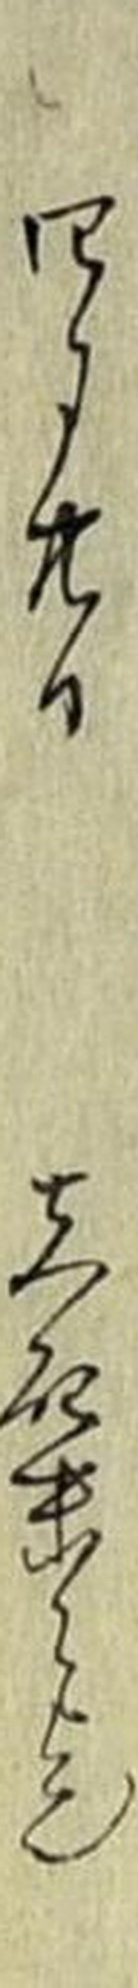四月廿日支配末々迄
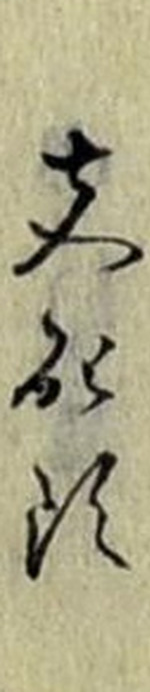支配頭
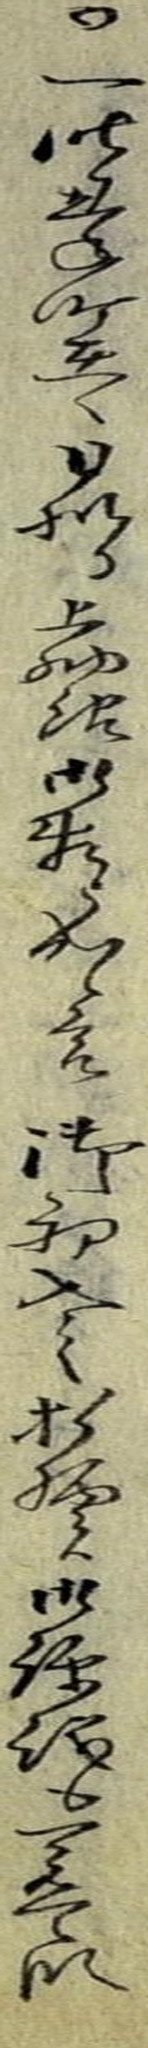○昨丑年町在へ日掛り上納銀御頼被成候節御初入之折柄には御評議も可有之段
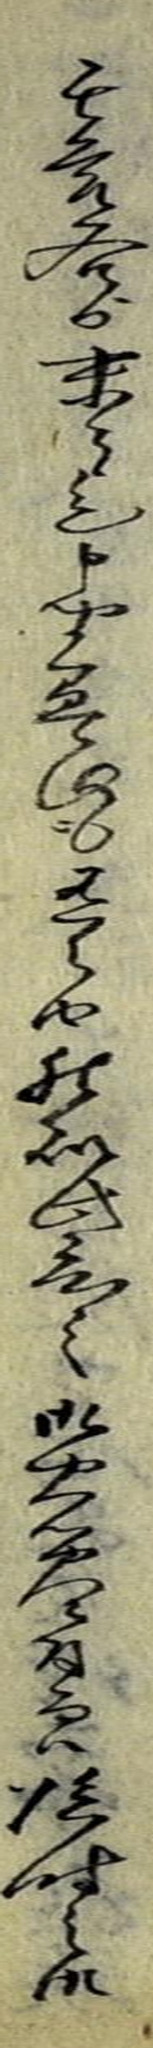其節各ゟ末々迄申聞置候趣も有之由然処此度之御火災に付而は臨時之御
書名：命令之部 六
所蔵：福井県文書館 Fukui Prefectural Archives
